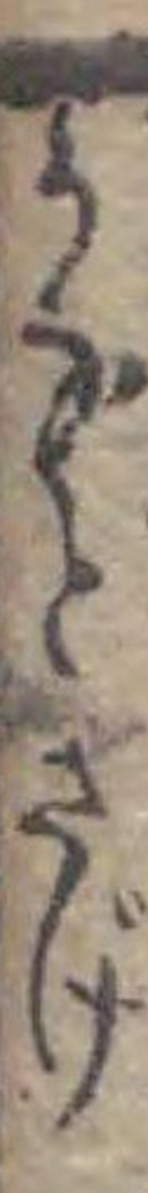かなとさげ
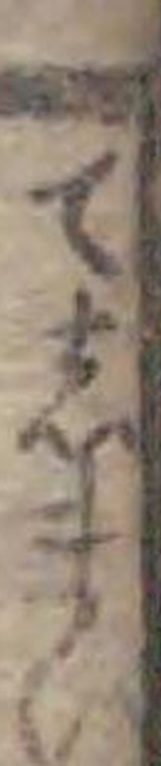てしまい
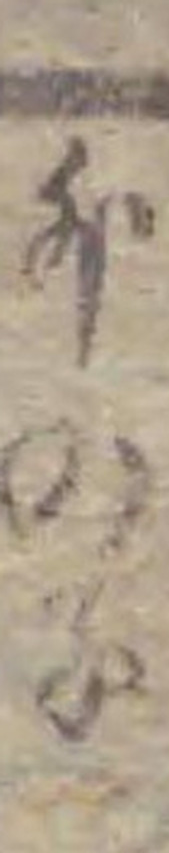外の子
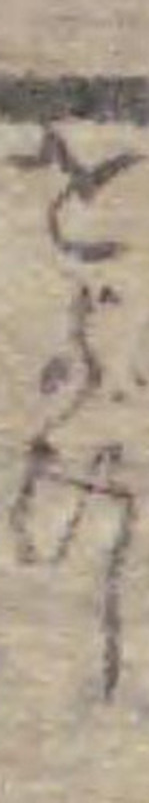をよびし
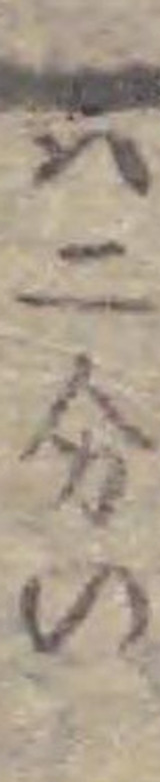は二分の
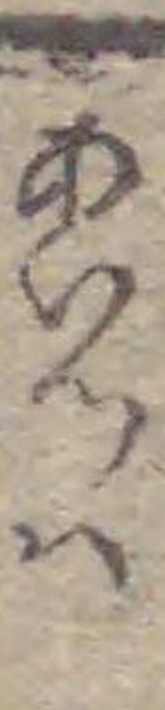あいつは
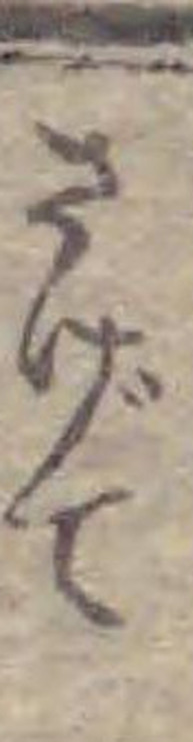さげて
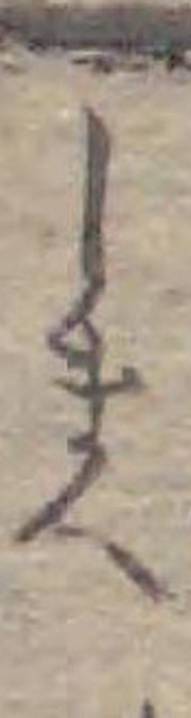しまへ
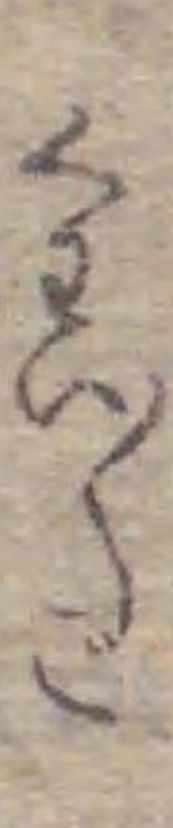くわい〳〵ご
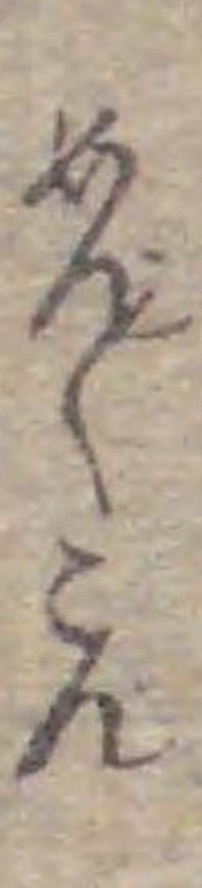めん〳〵こん
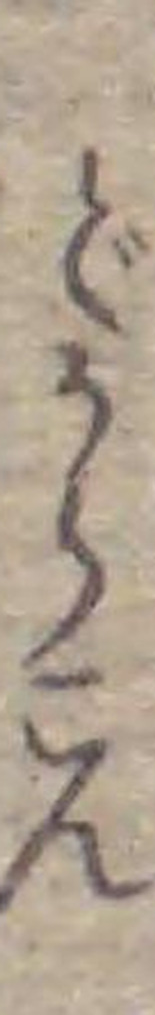どからこん
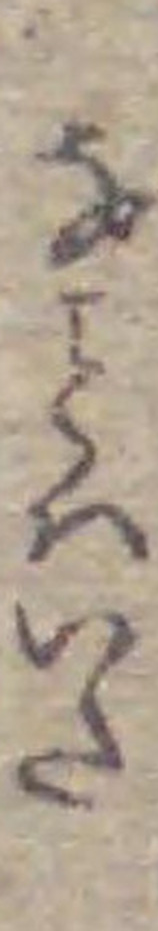なことはいた

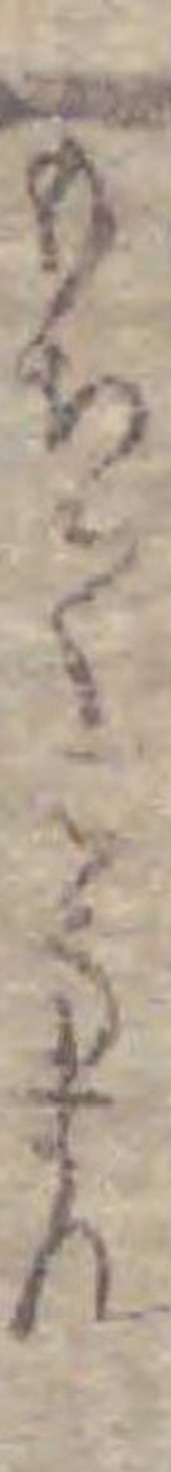もちてこうまん
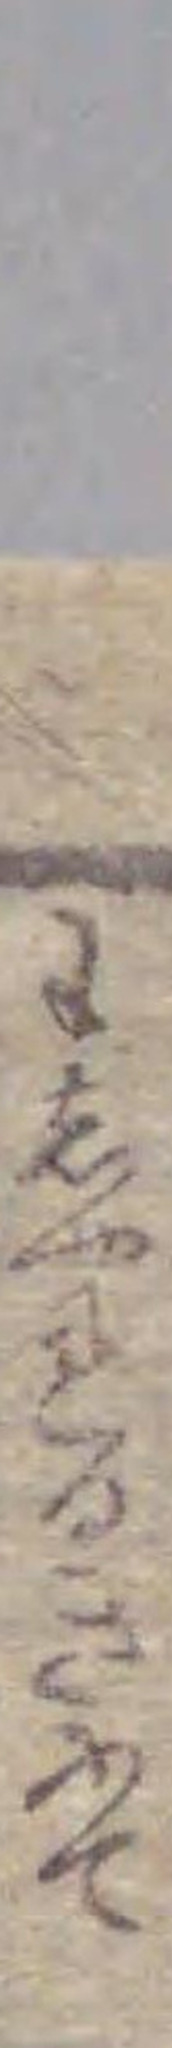にしやれるきにて
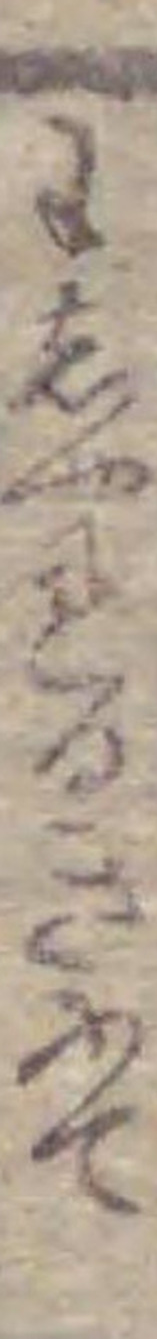にしやれるきにて
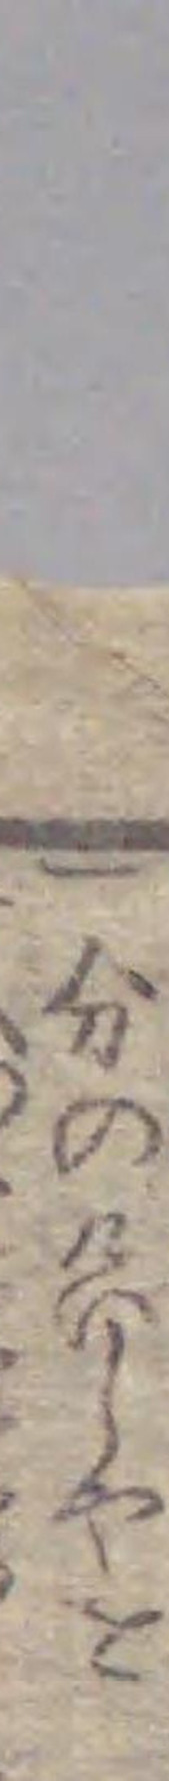一分のけいしやを
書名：紺屋百物語 : 3巻
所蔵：国立国会図書館 National Diet Library, JAPAN
